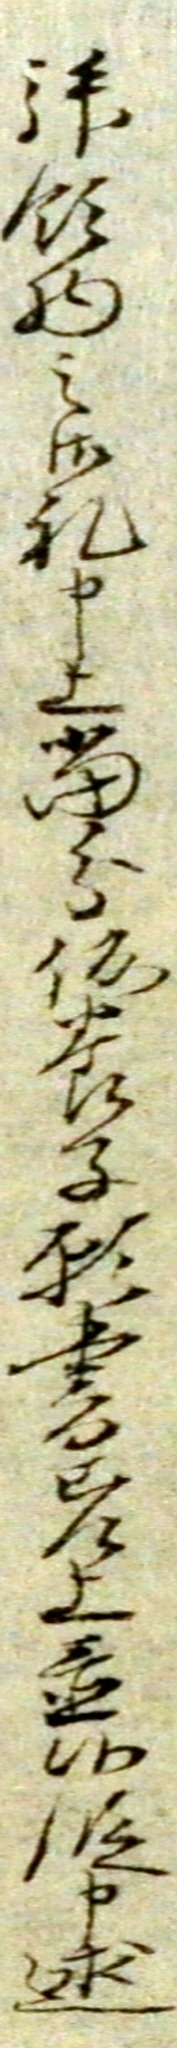拝領物之御礼申上当分仮養子願書差上置候段申述
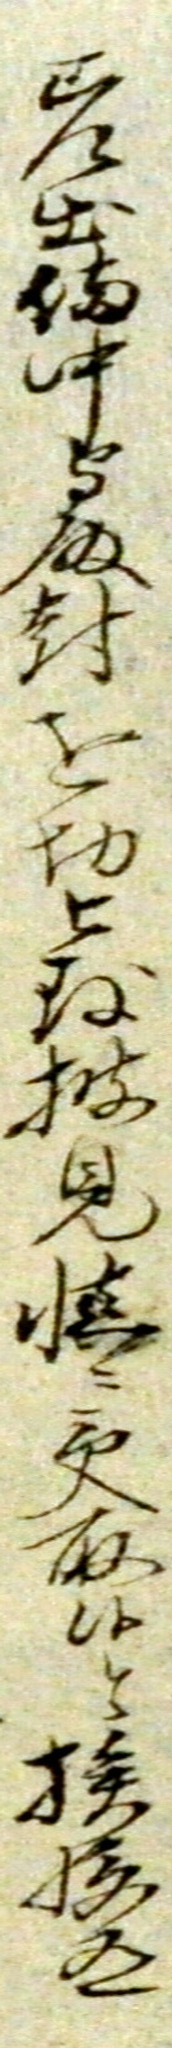差出備中守殿封を切ヒ致披見慎二受取候と挨拶有
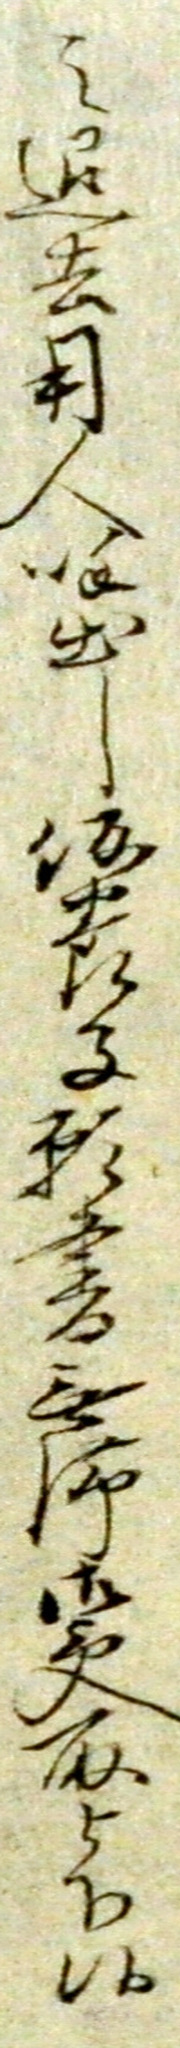之退去用人呼出仮養子願書無滞御受取ヒ下候
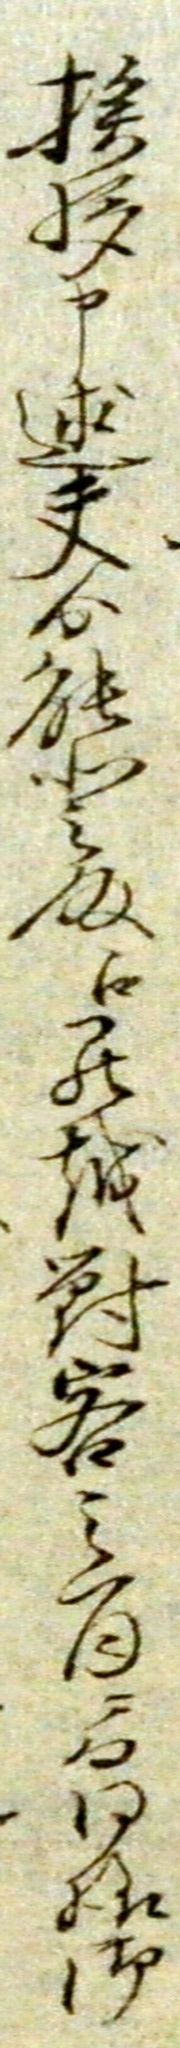挨拶申述夫ゟ能登守殿江罷越対客之間ニ而同様御
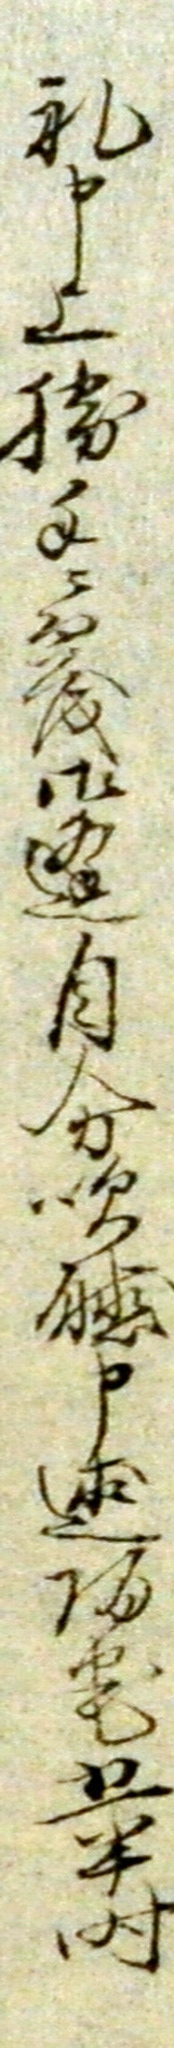礼申上勝手ニ而茂御逢自分吹聴申述帰宅五半時
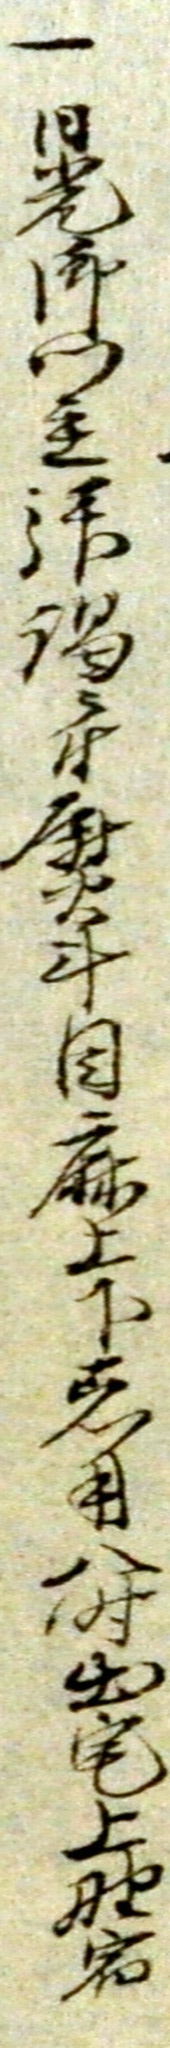一日光御門主拝越ニ付熨斗目麻上下着用八時出宅上野宿
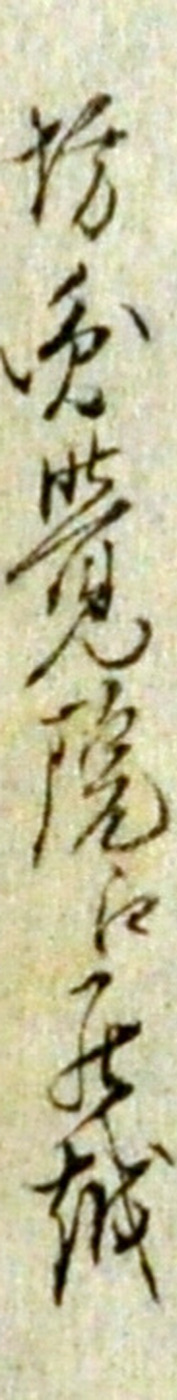坊圓覚院江罷越
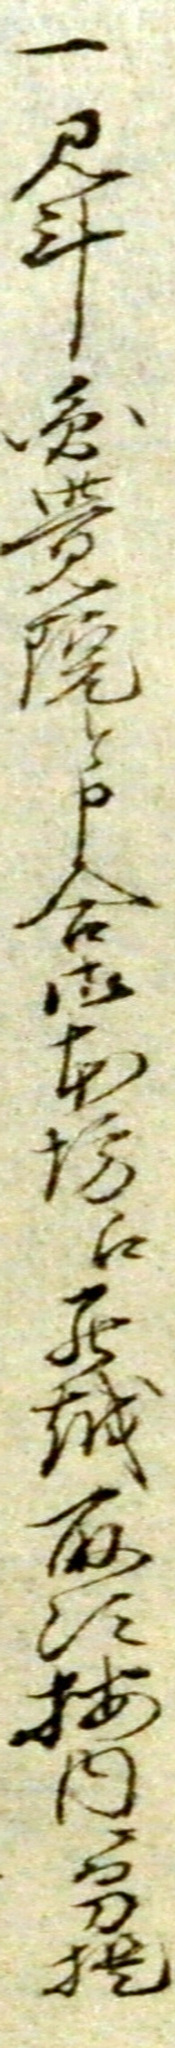一見斗圓覚院と申合御本坊江罷越取次案内ニ而刀提
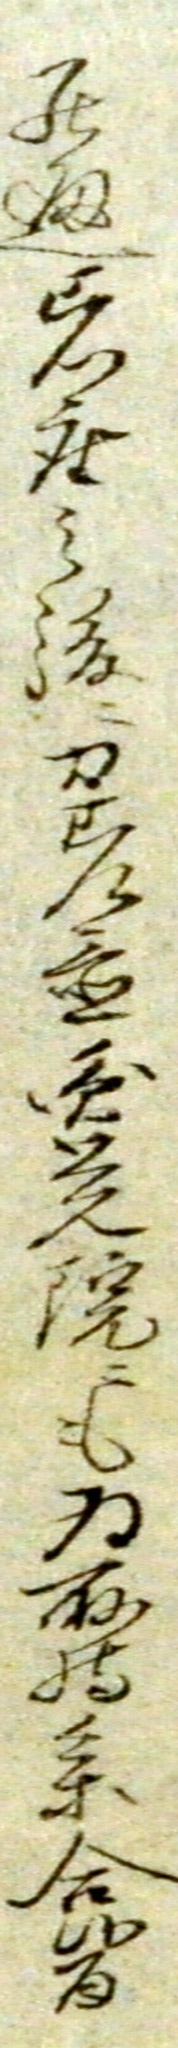罷通着座之後ニ刀差置圓覚院ニも為取持参合候間
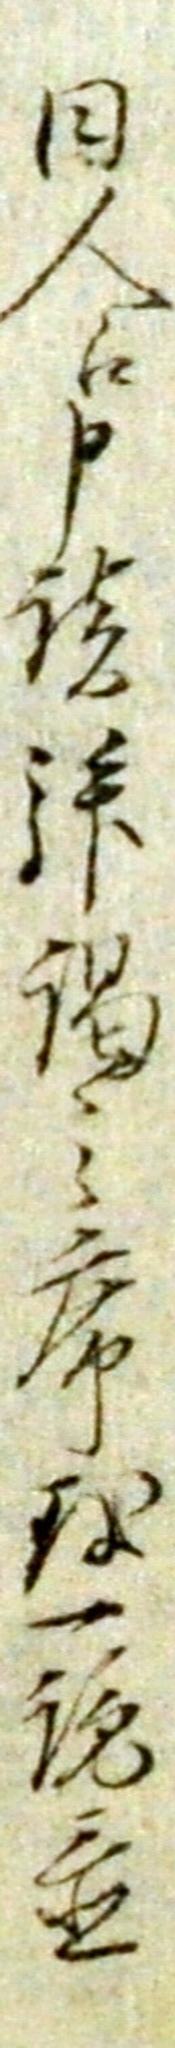同人江申談拝謁之席致可銘置
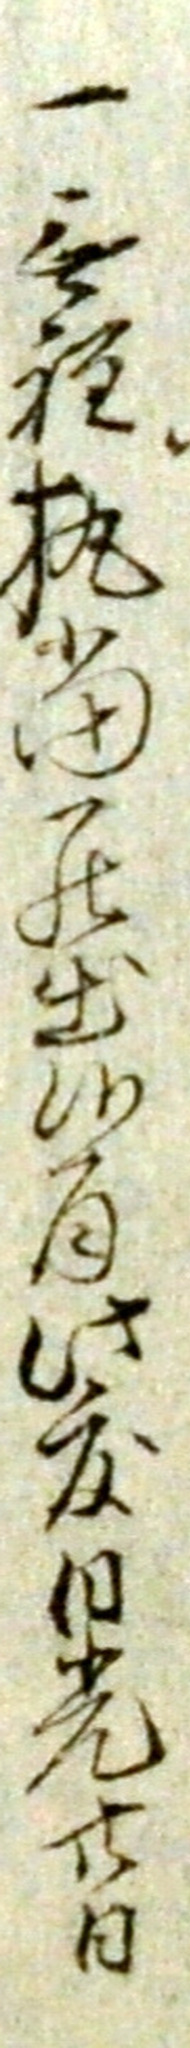一無程執當罷出候間此度日光廿日
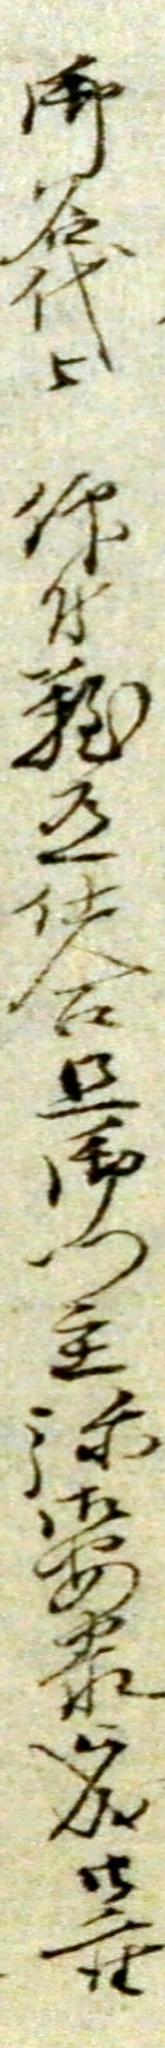御名代ヒ仰付難有仕合且御門主弥御安泰被成御座
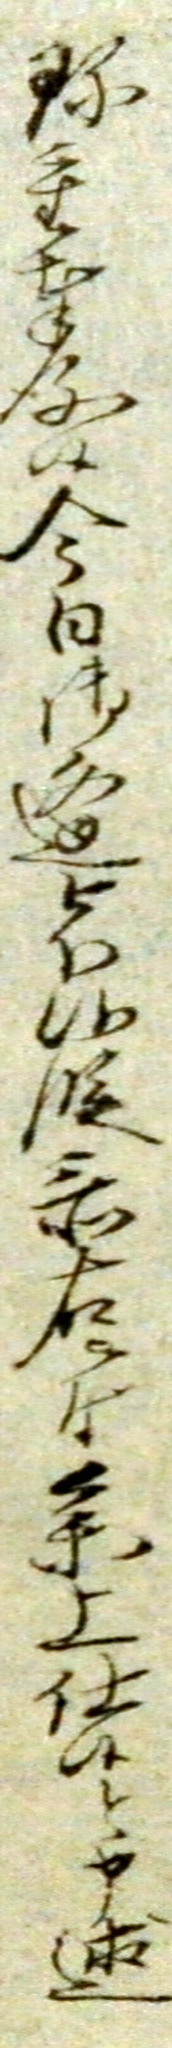珍重奉存候今日御逢ヒ下候段忝右二付参上仕候と申述
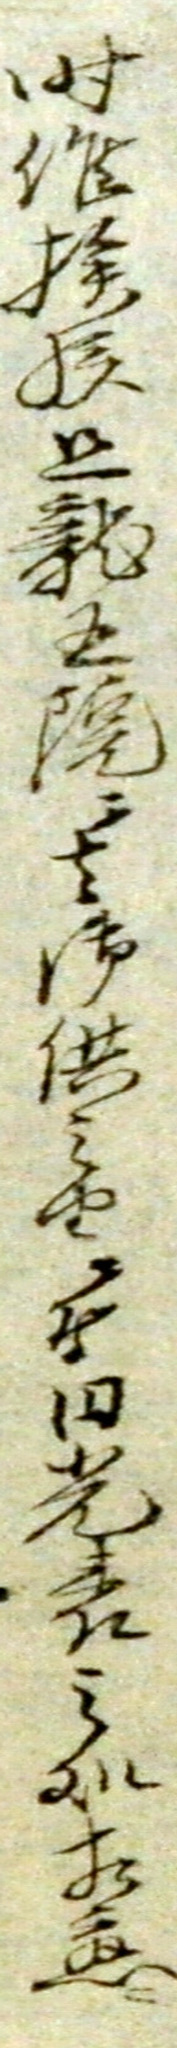時候挨拶且竜王院二者御供之由二付日光表之処相応
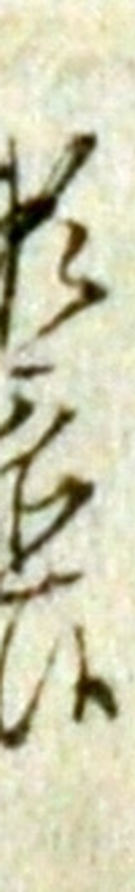頼置候

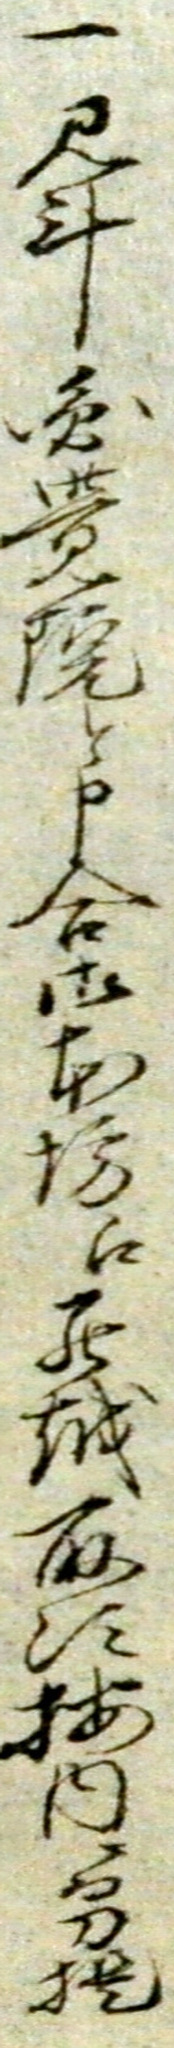一見斗圓覚院ゟ申合御本坊江罷越取次案内ニ而刀提
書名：日光御名代相勤候節ノ留
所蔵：伊那市立高遠町図書館・合同会社AMANE
